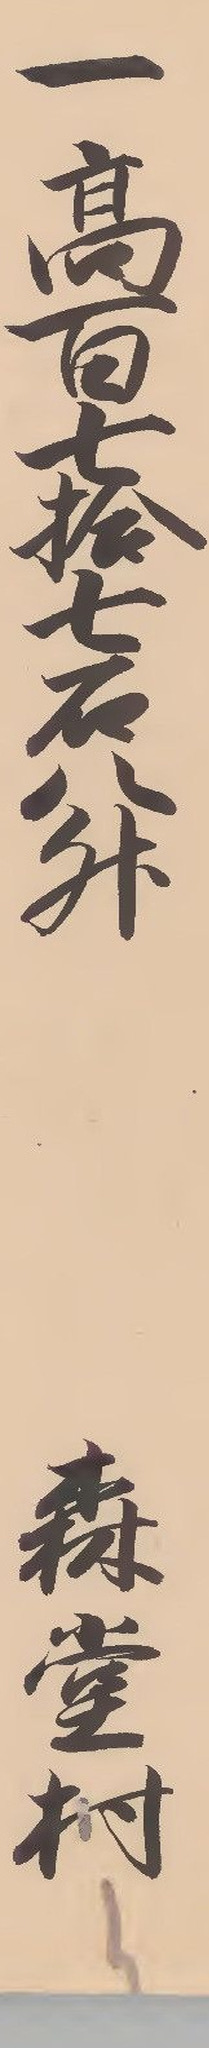一高百七拾七石八升森堂村
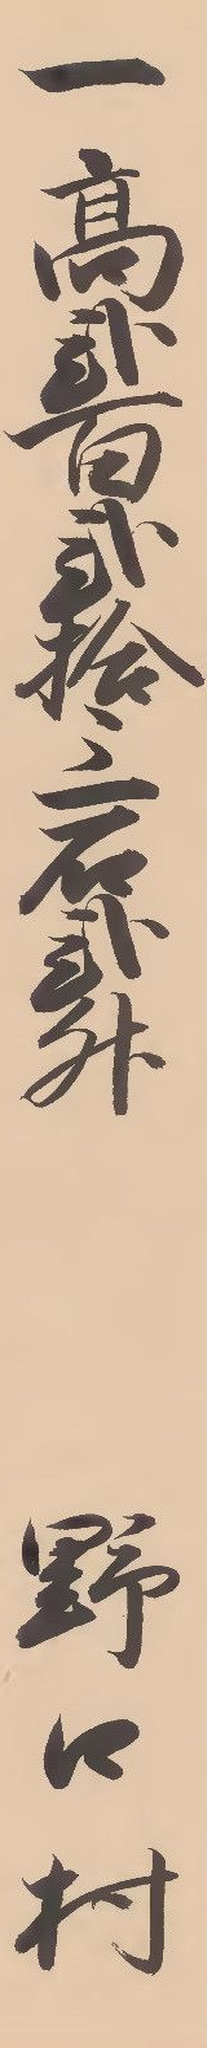一高弐百弐拾三石弐升野口村
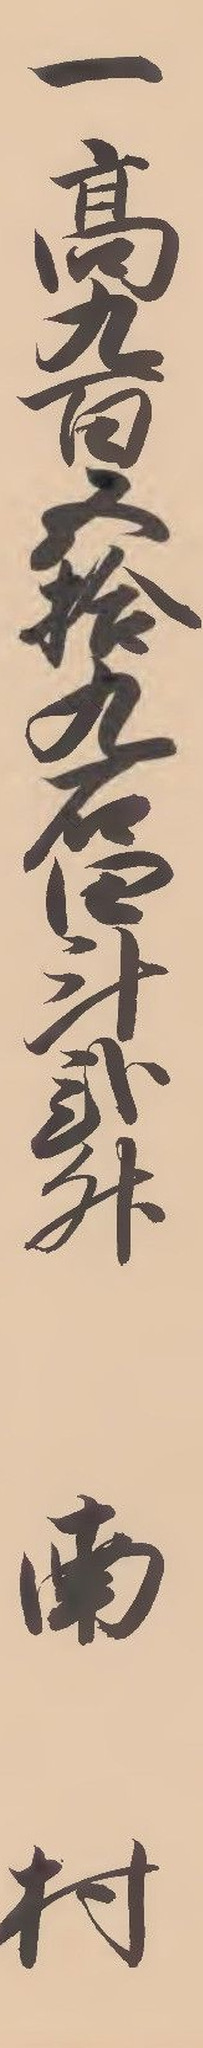一高九百五拾九石四斗弐升南村
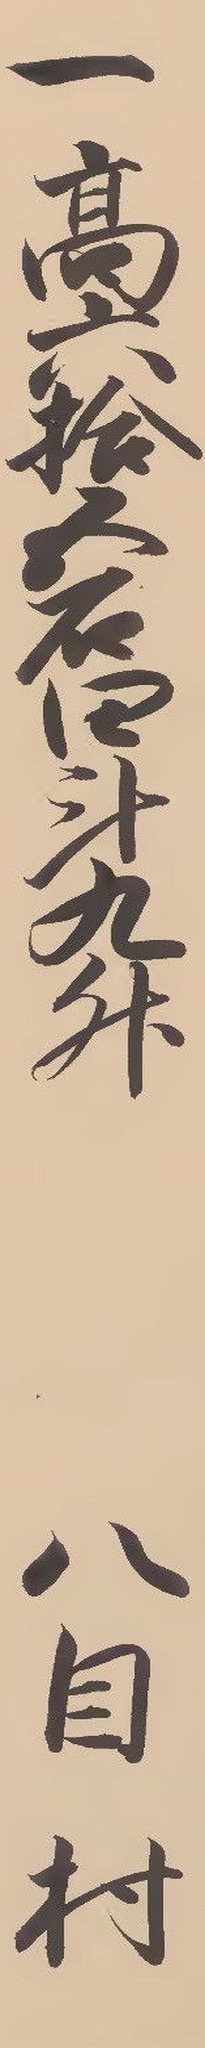一高六拾五石四斗九升八目村
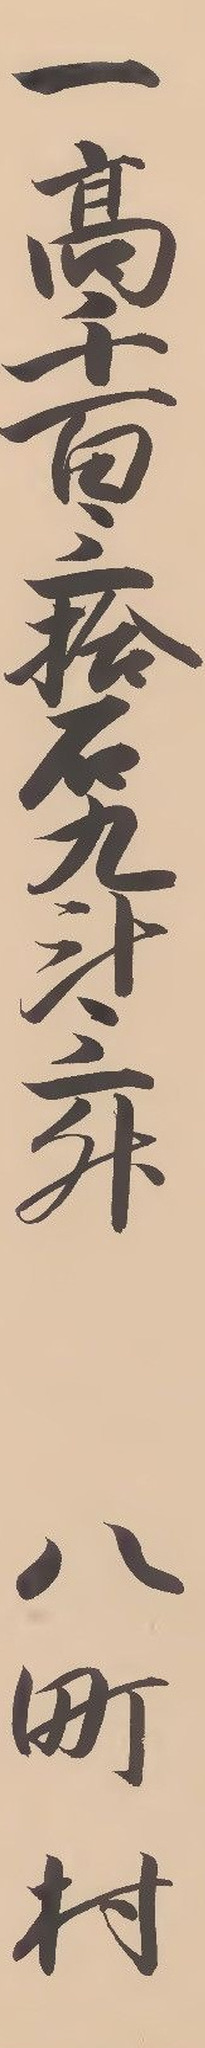一高千百三拾石九斗三升八町村
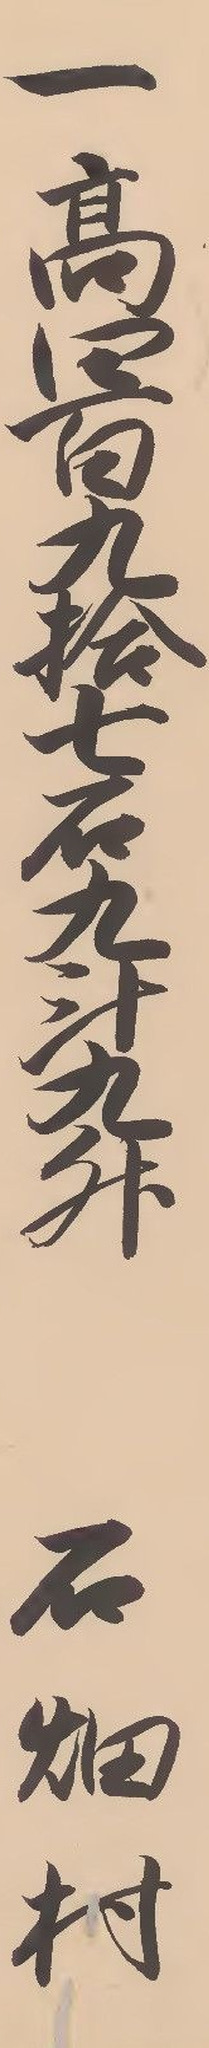一高四百九拾七石九斗九升石畑村
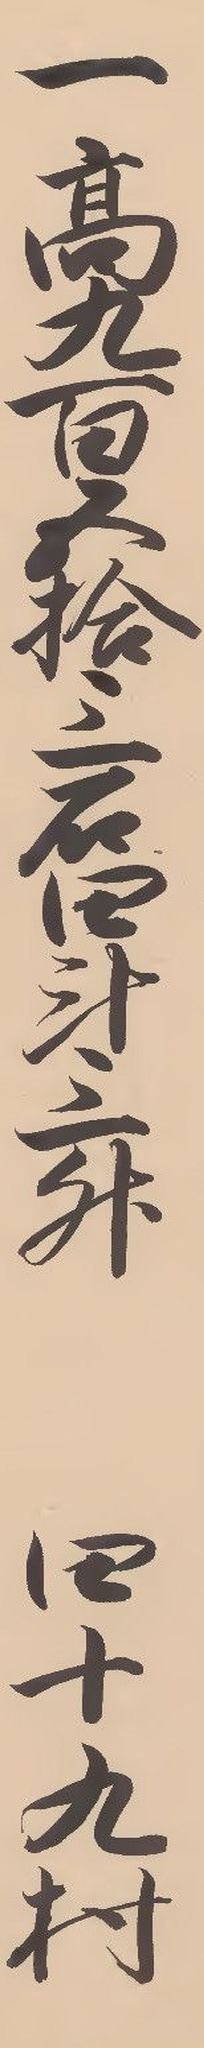一高九百五拾三石四斗三升四十九村

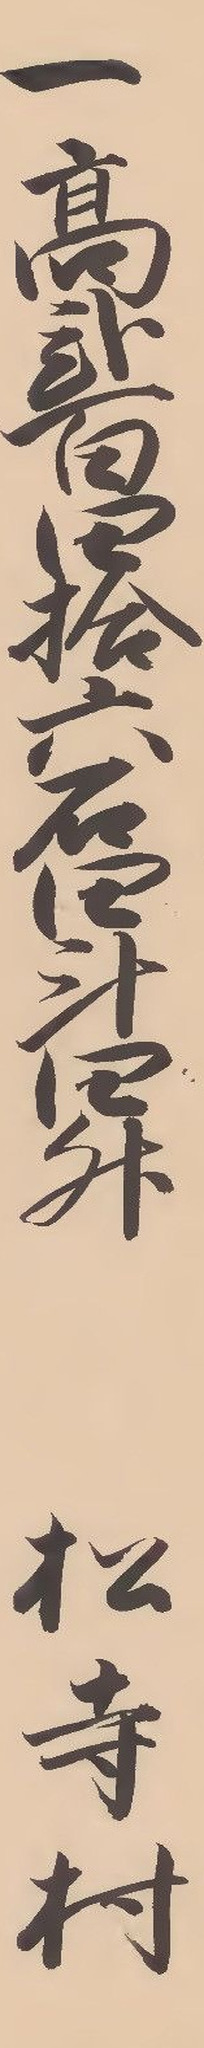一高弐百四拾六石四斗四升松寺村
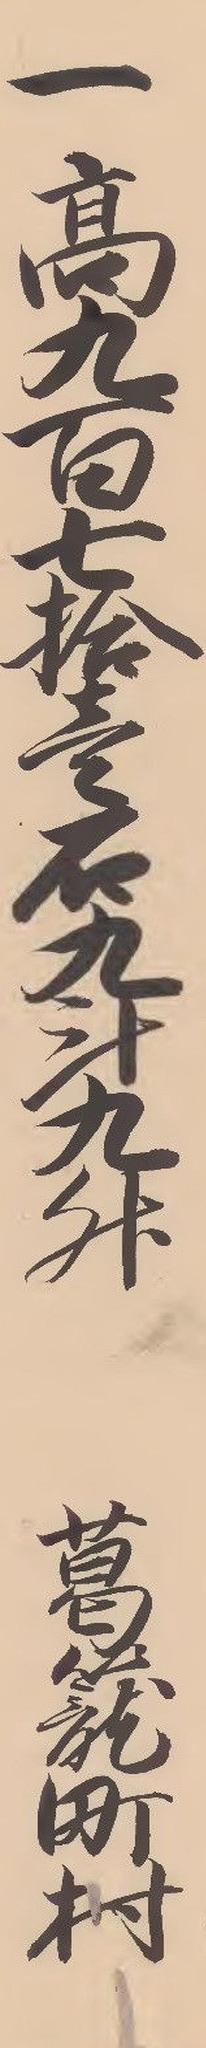一高九百七拾壱石九斗九升葛篭町村
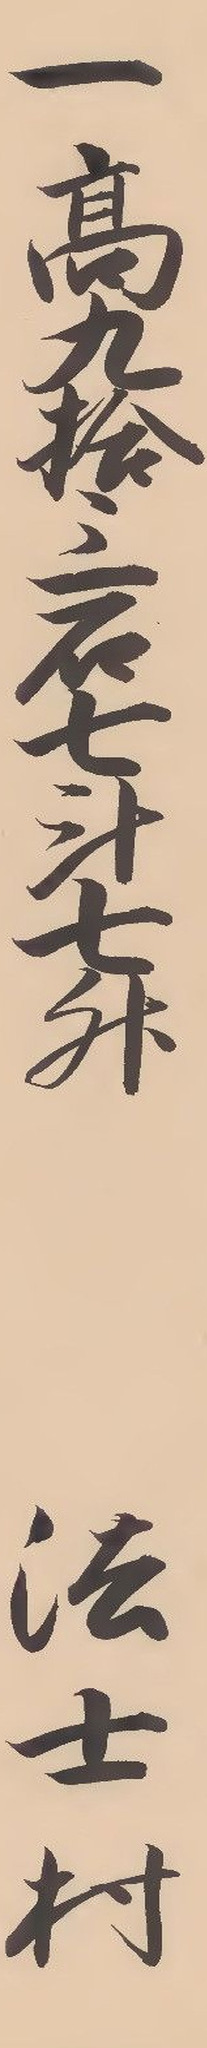一高九拾三石七斗七升法士村
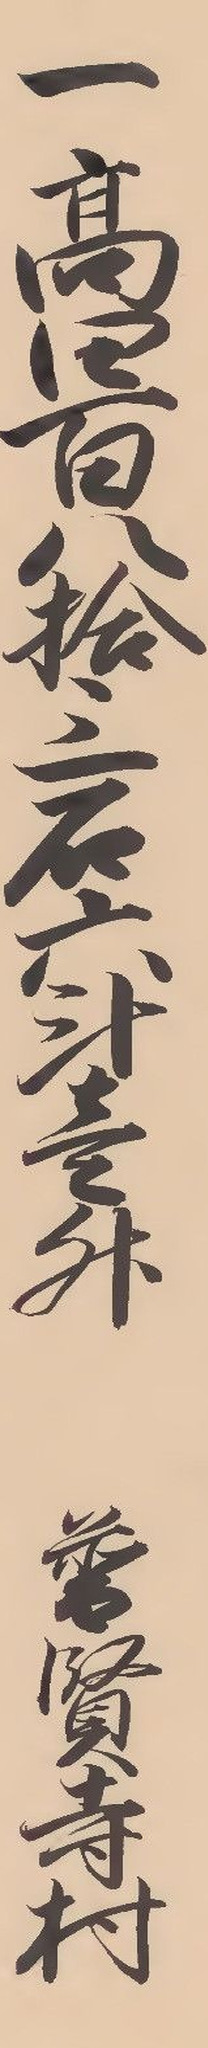一高四百八拾三石六斗壱升普賢寺村
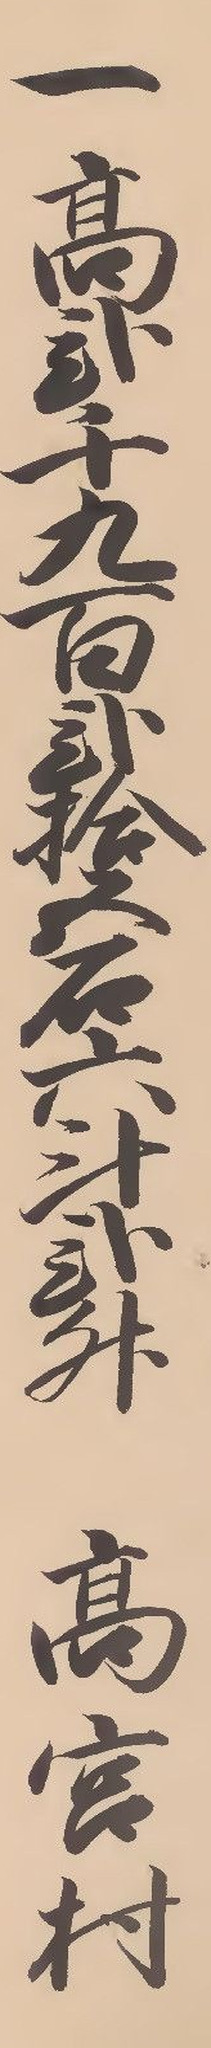一高弐千九百弐拾五石六斗弐升高宮村
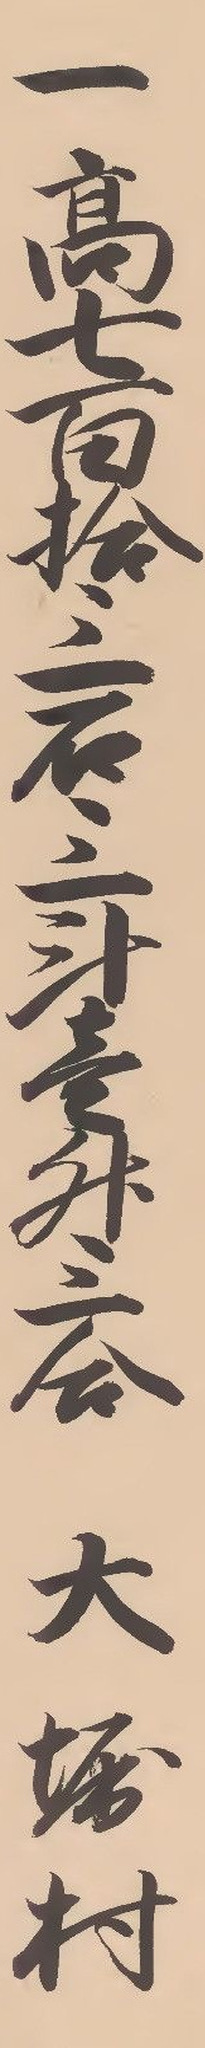一高七百拾三石三斗壱升三合大堀村
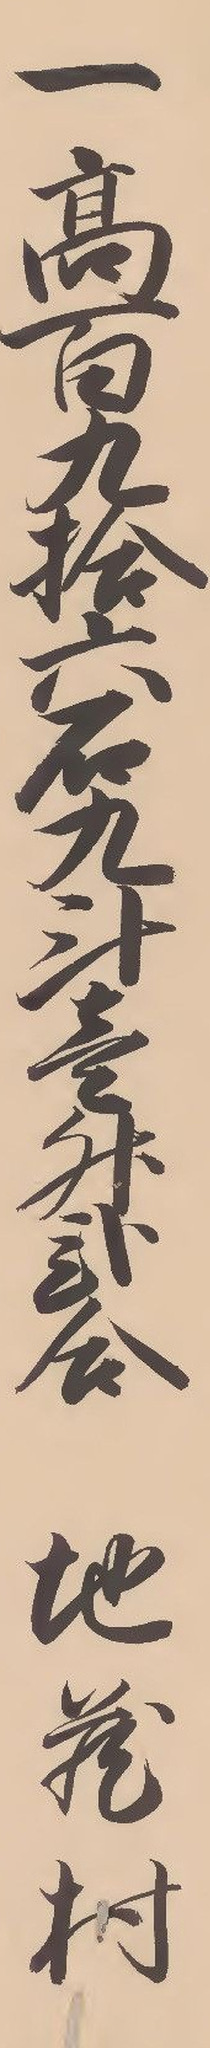一高百九拾六石九斗壱升弐合地蔵村
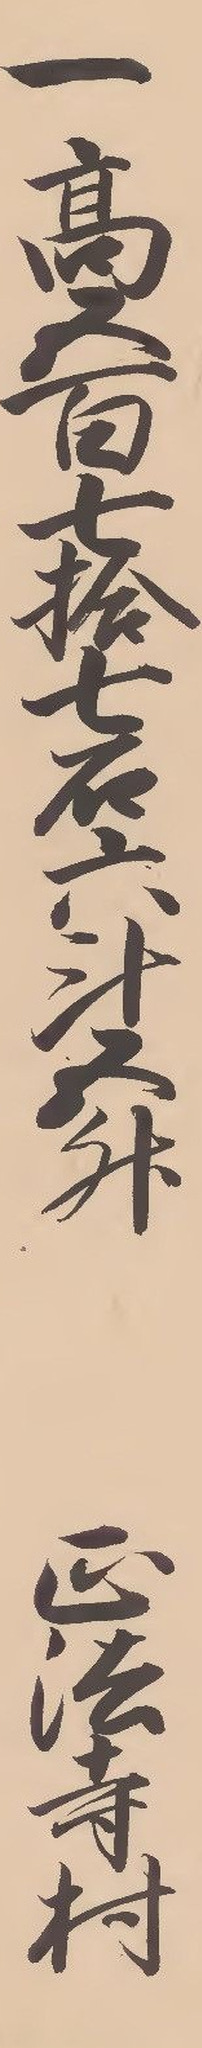一高五百七拾七石六斗五升正法寺村

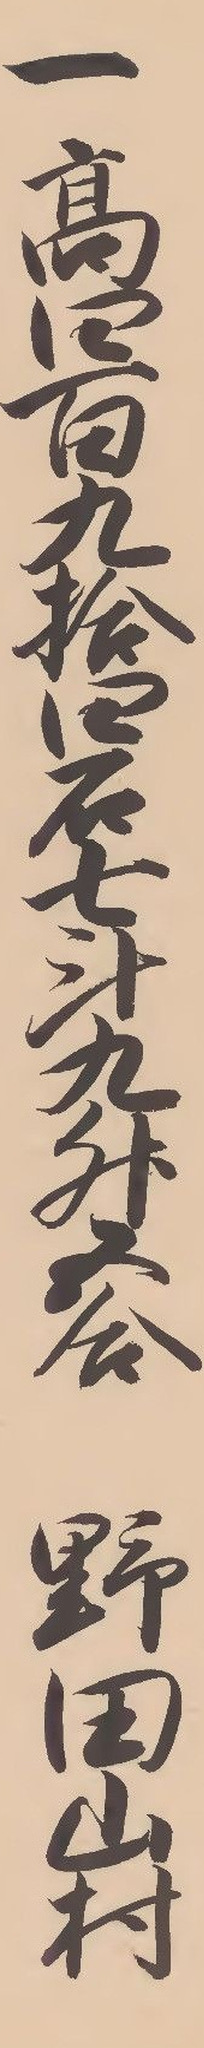一高四百九拾四石七斗九升五合野田山村
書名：近江国郷帳
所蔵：国立公文書館 National Archives of Japan
